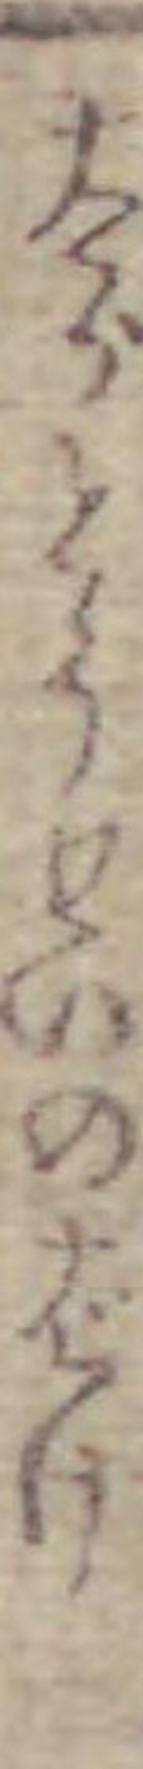太郎とうせいのばけ
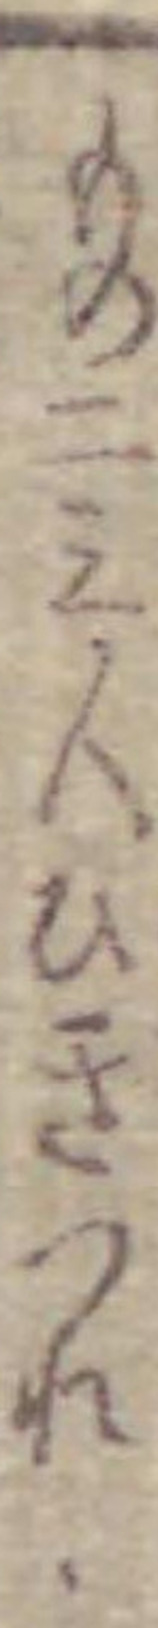もの二三人ひきつれ
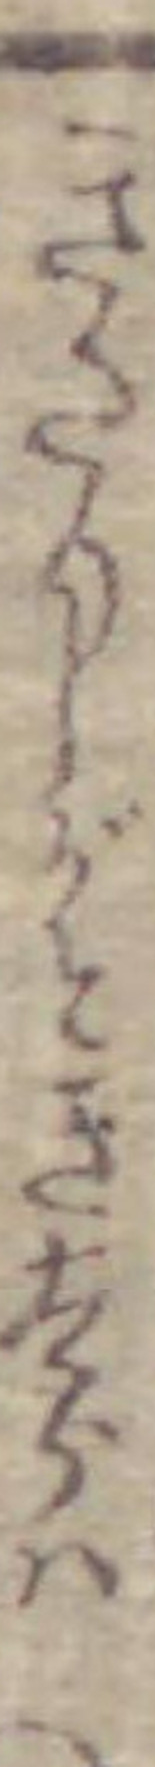きたりしがとき太郎は
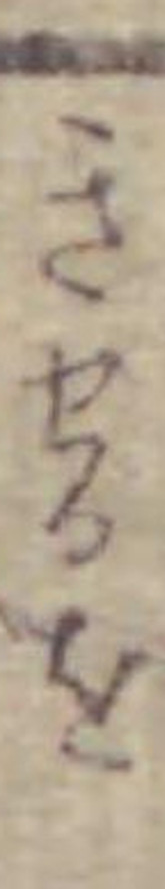きせるを
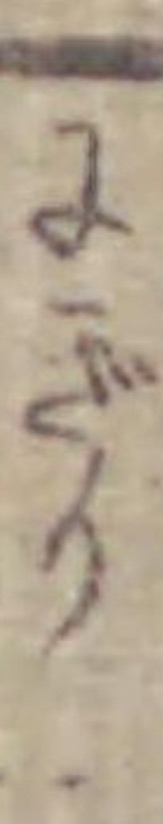にぎり
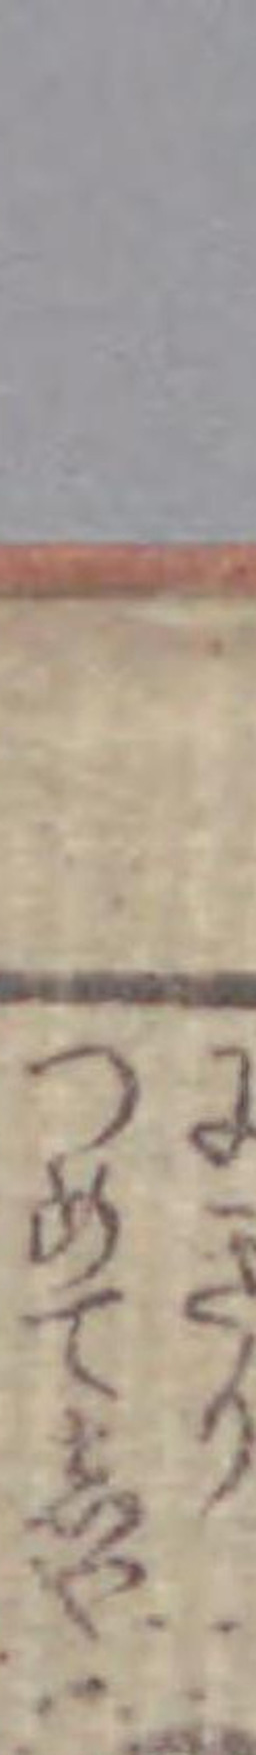つめてしや
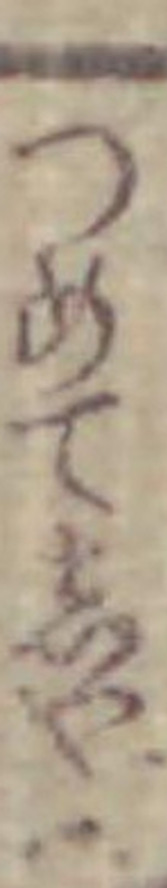つめてしや
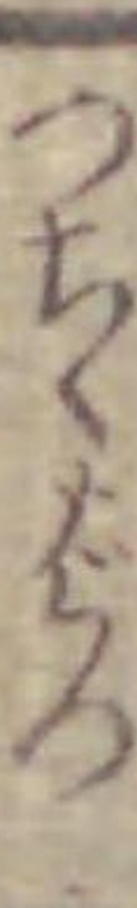つちくばつ
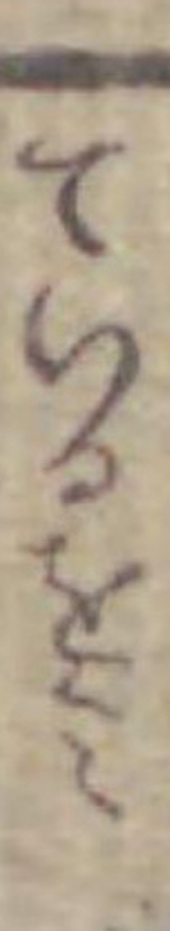ているをみ
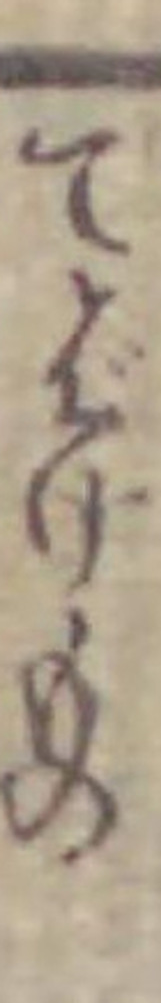てばけもの
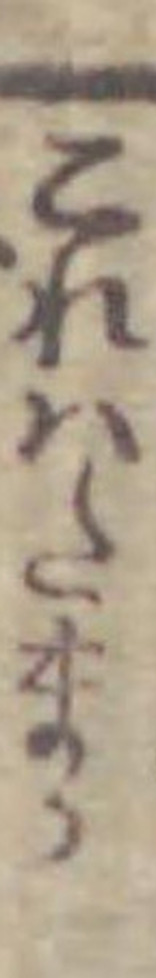これはたまら
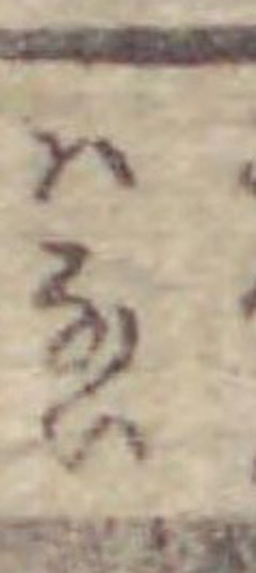はない
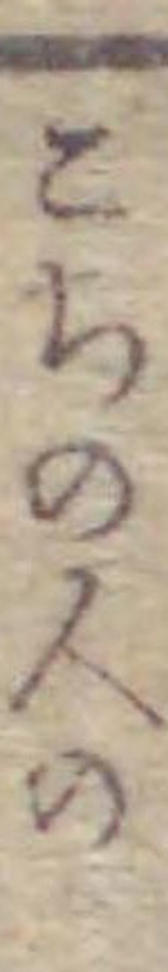こちの人の
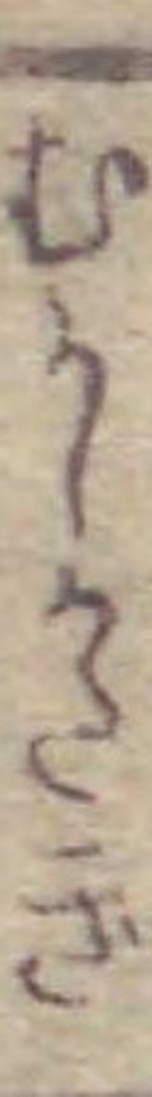むかしかたぎ
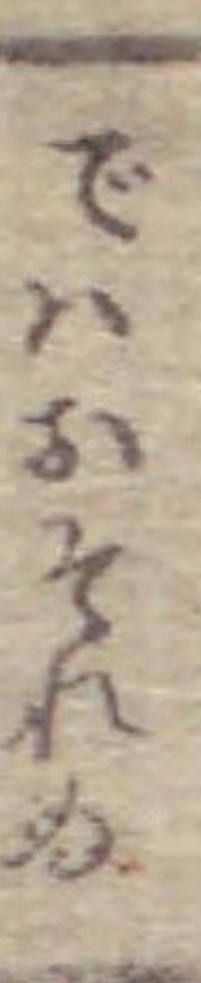ではおそれぬ

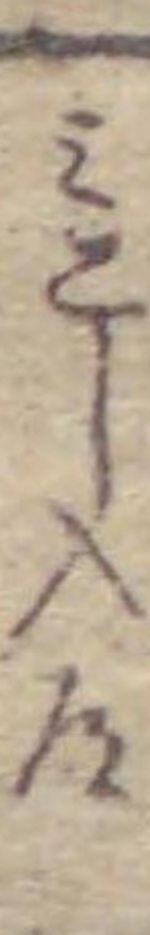みこし入道
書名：二日替 : 2巻
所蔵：国立国会図書館 National Diet Library, JAPAN
